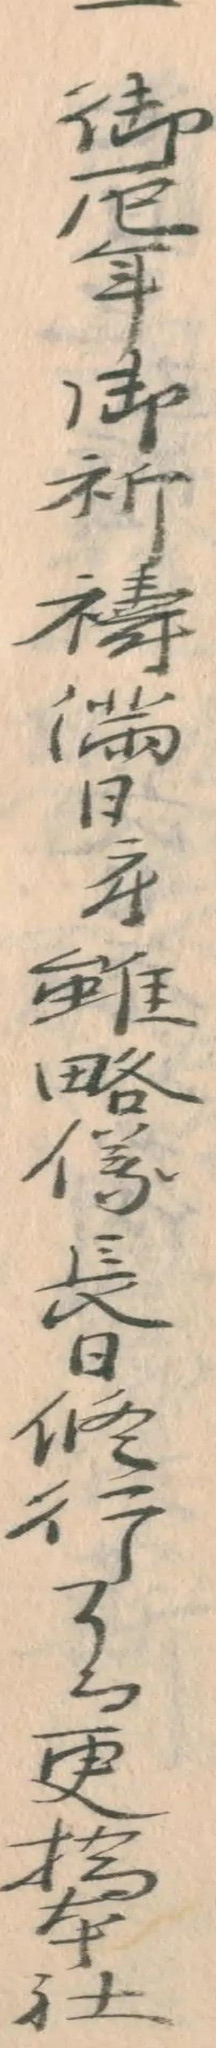一御厄年御祈祷満日ニ付雖略儀長日修行了而更橋本社
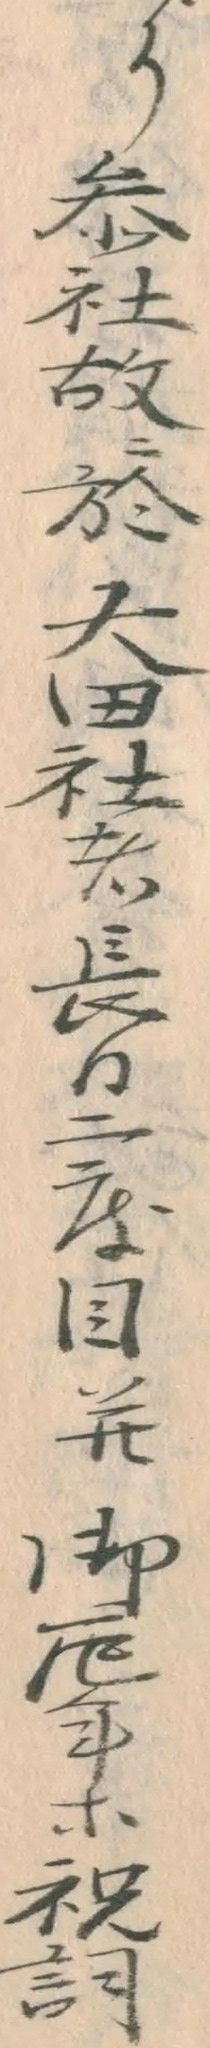より参社故ニ於大田社は長月二度目幷御辰年等祝詞
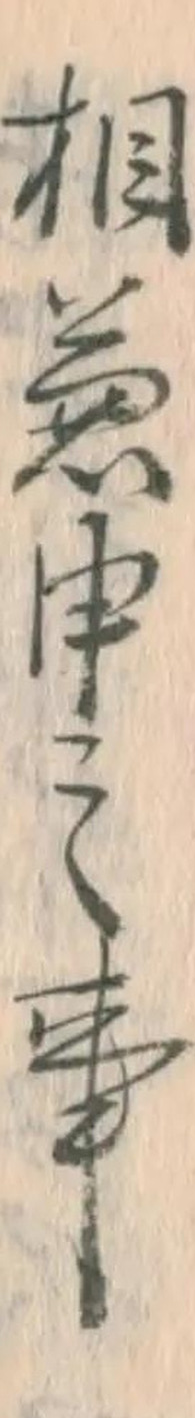相兼申之事
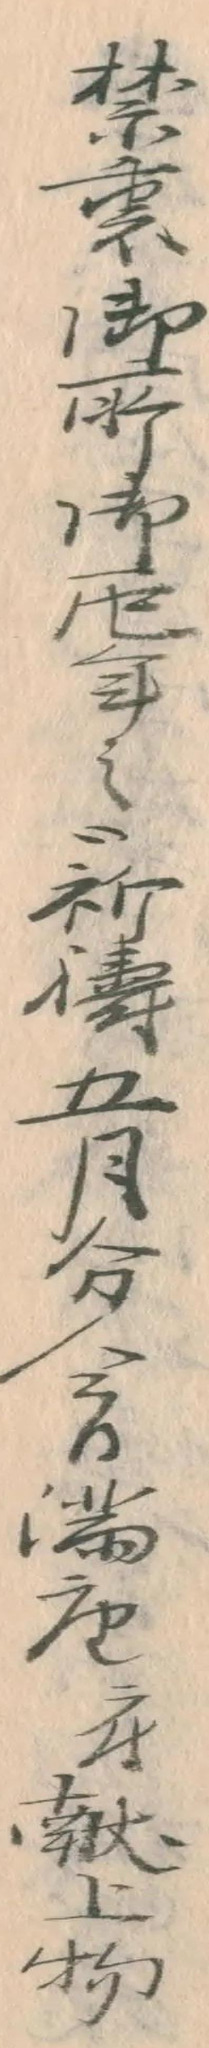一禁裏御所御厄事之御祈祷五月分今日満座ニ付献上物
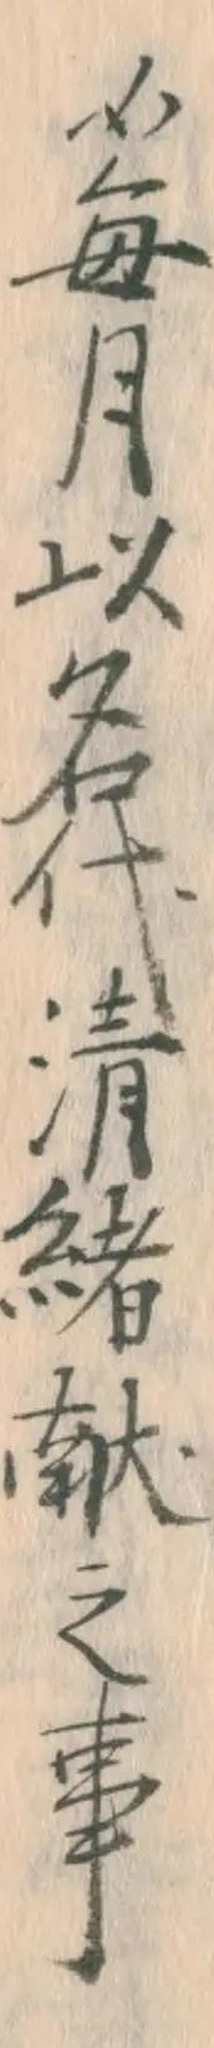如毎月以名代清緒献之事
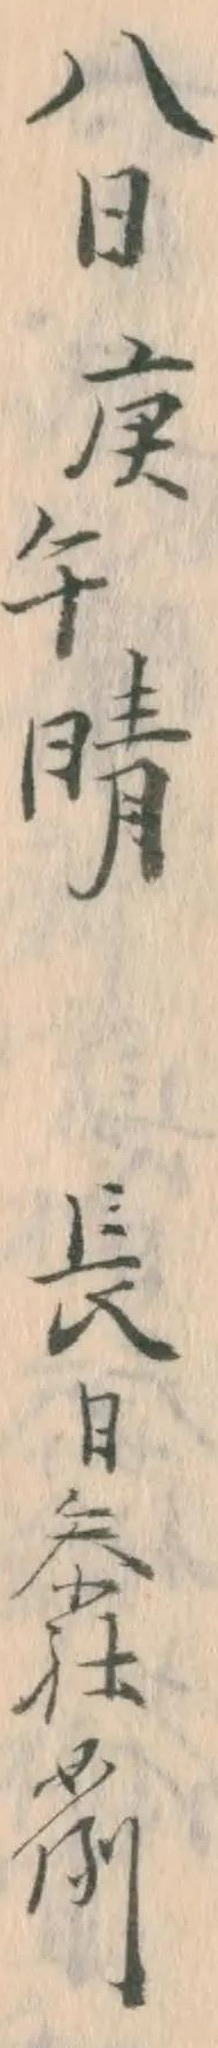八日庚午晴長日参社如例
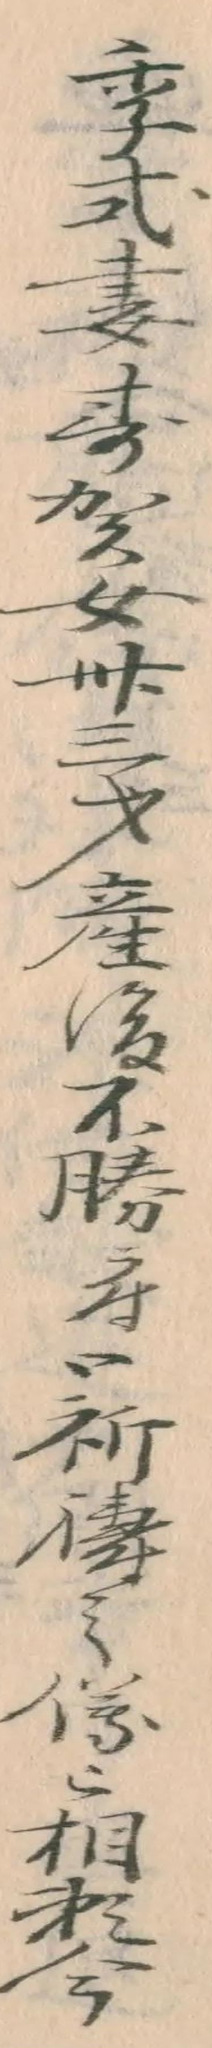一季式妻寿賀女卅三才産後不勝付御祈祷之儀被相頼今
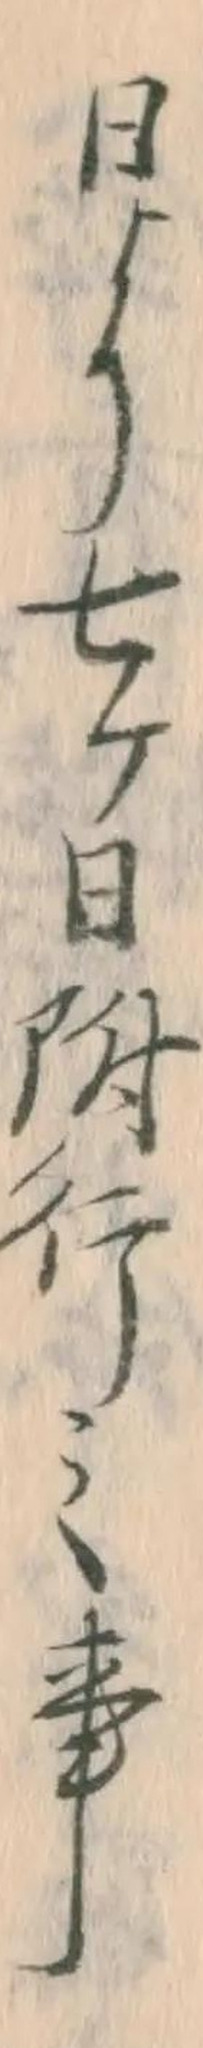日より七ヶ日附行之事
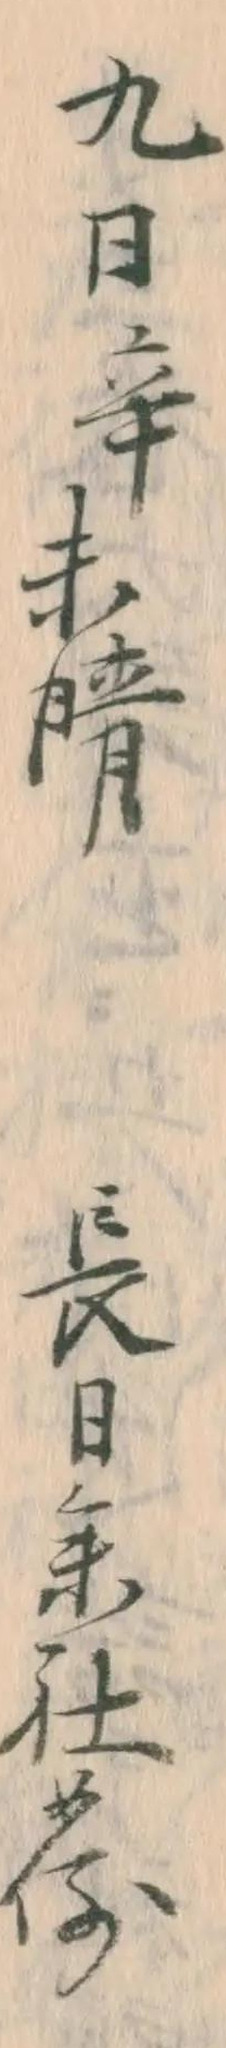九日辛未晴長日参社如例
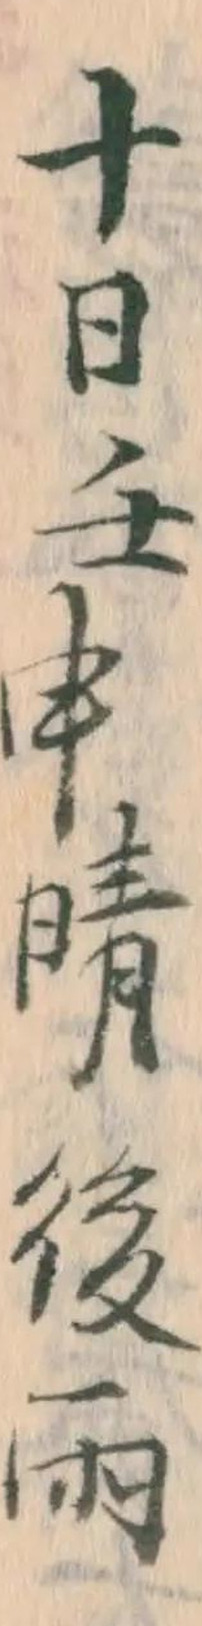十日壬申晴後雨
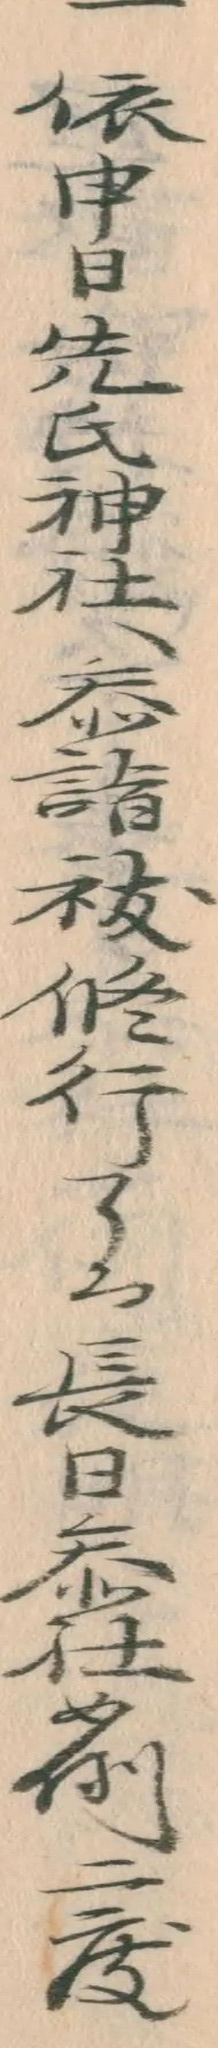一依申日先氏神社へ参詣祓修行了而長日参社如例二度
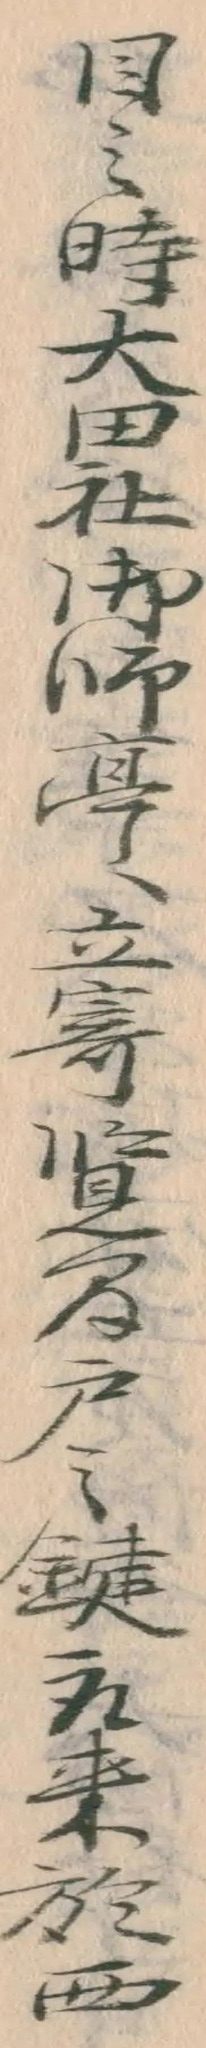目之時大田社御師亭へ立寄覧間戸之鍵取来於西
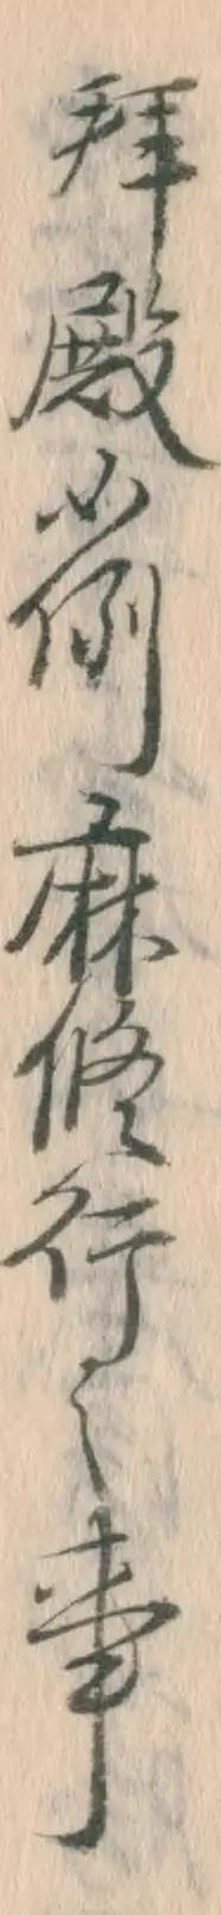拜殿如例麻修行之事
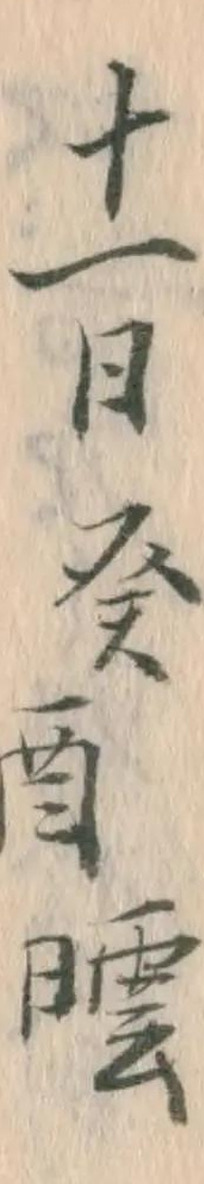十一日癸酉曇
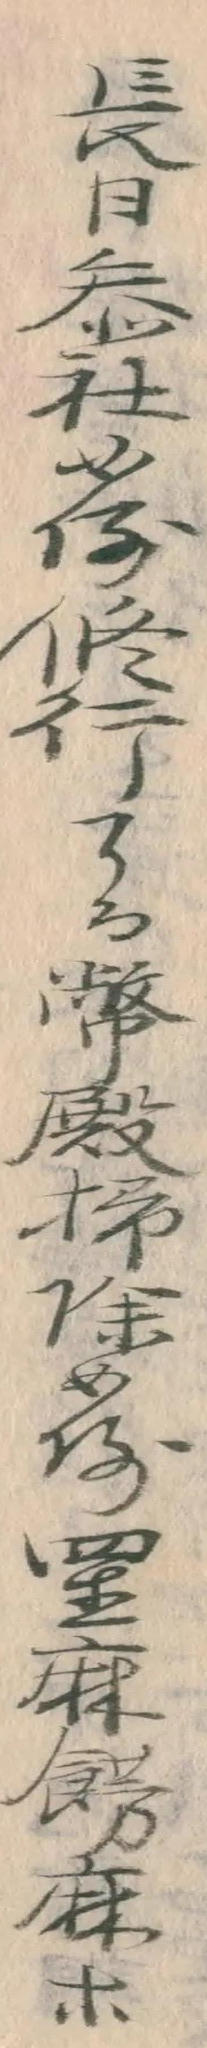一長日参社如例修行了而幣殿掃除如例置麻餝麻等
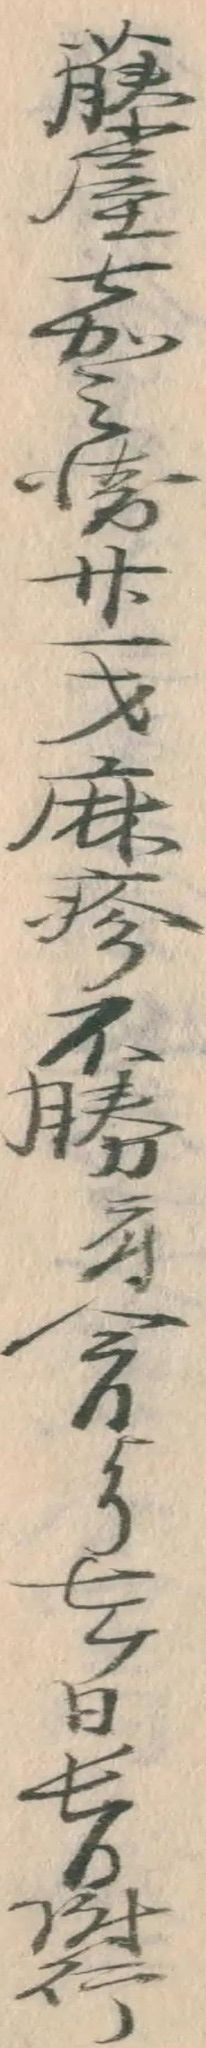一藤屋嘉兵衛廿一才麻疹不勝ニ付今日より七ケ日長日附行
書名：賀茂社記録. 第73冊
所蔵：国立国会図書館 National Diet Library, JAPAN
